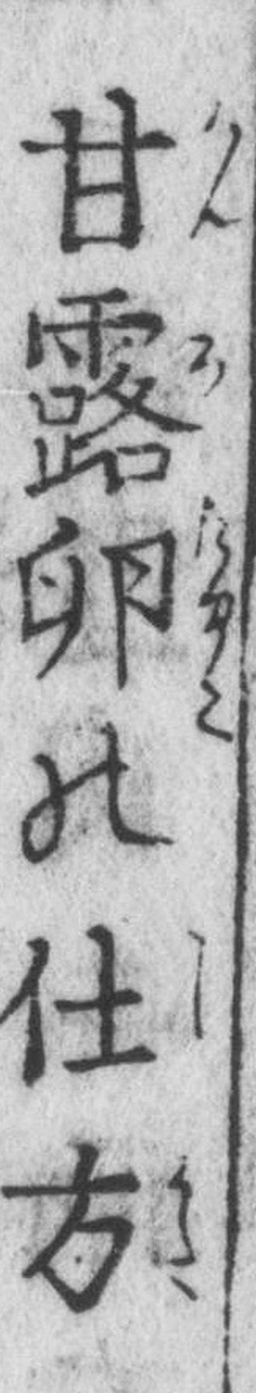甘露卵の仕方
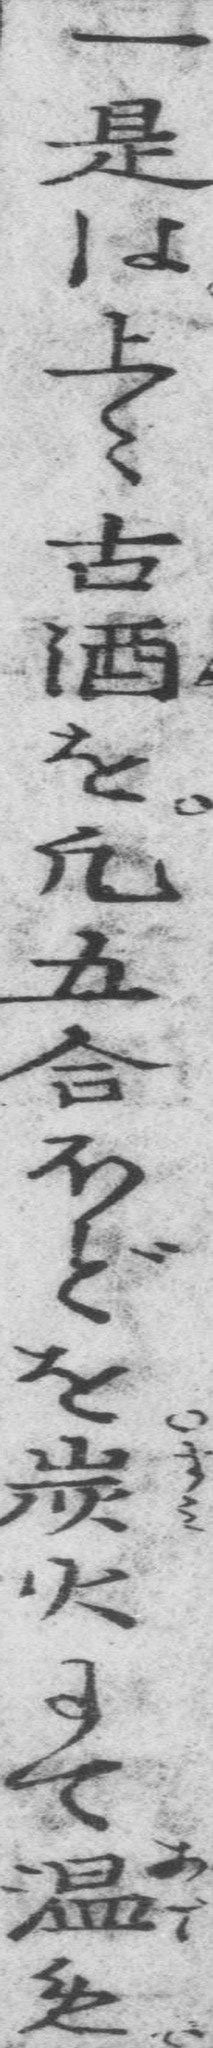一是は。上々古酒を。凡五合ほどを。炭火にて温め。
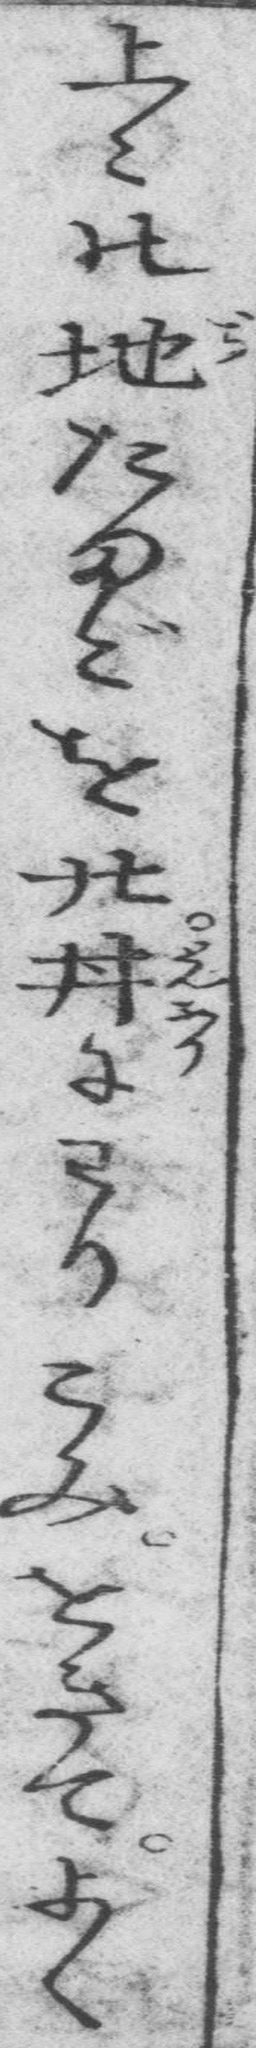上々の地たまごを廿。丼にわりこみ。をきて。よく
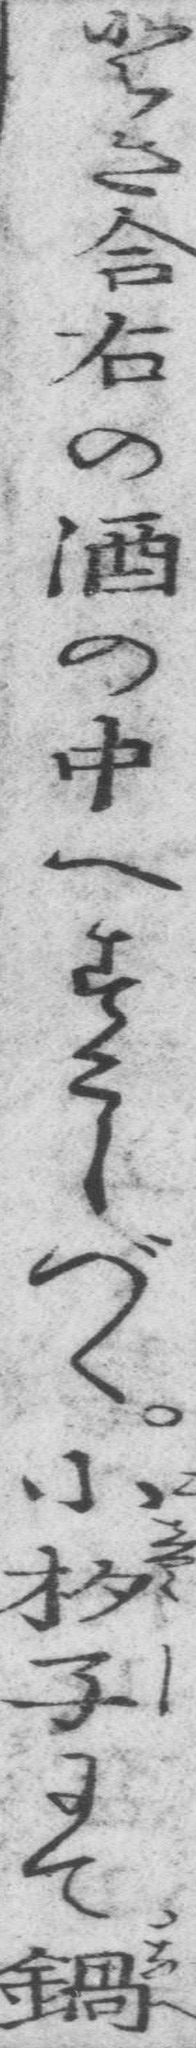とき合せ右の酒の中へすこしづゝ。小杓子にて。鍋
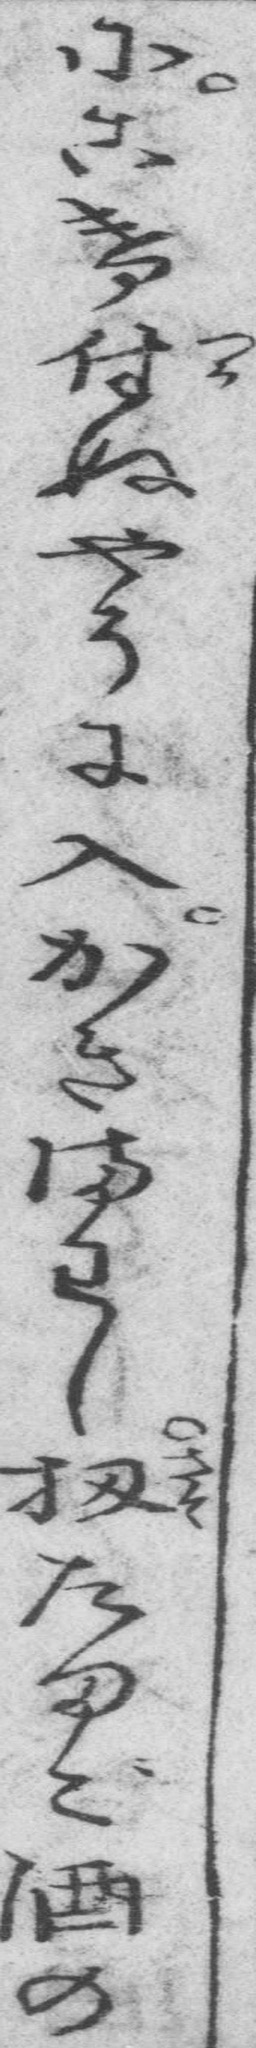に。こけ付ぬやうに入。かきまわし。扨たまご酒の
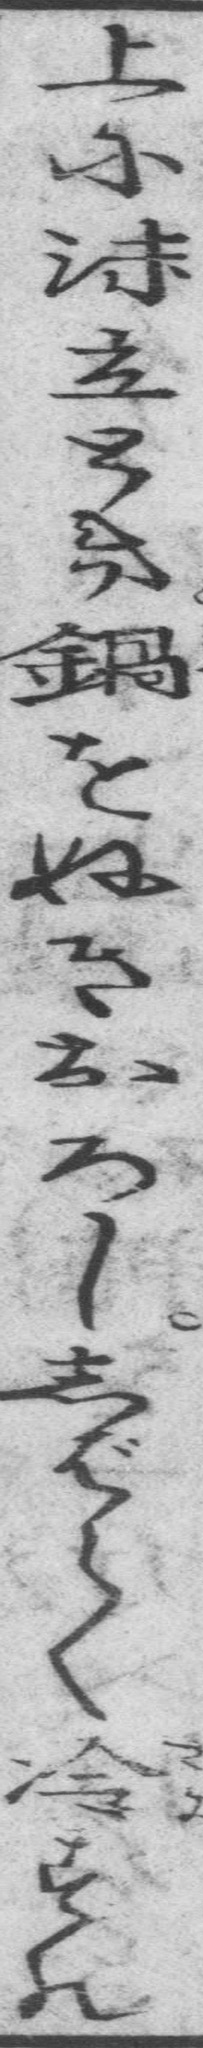上に。沫立とき。鍋をぬきおろし。しばらく冷すか

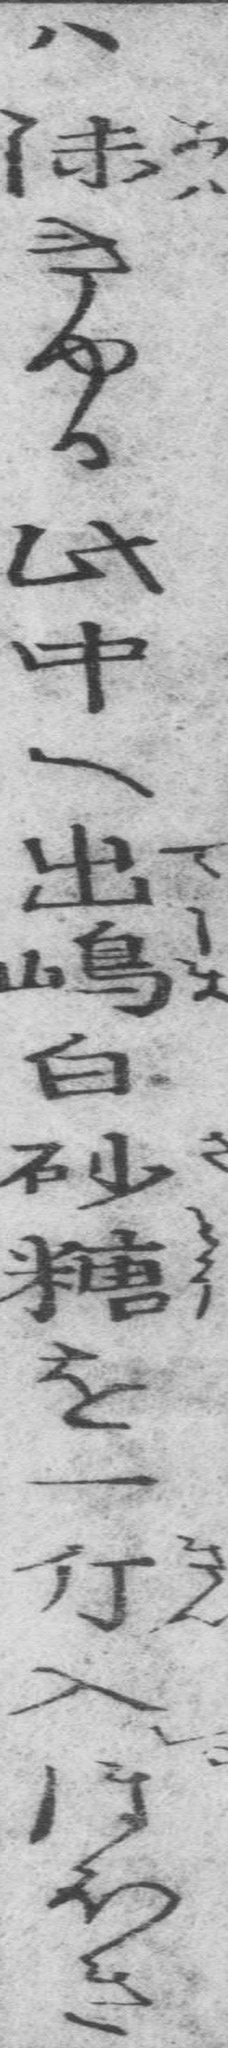は沫きゆる此中へ出嶋白砂糖を一斤入れ。おほき
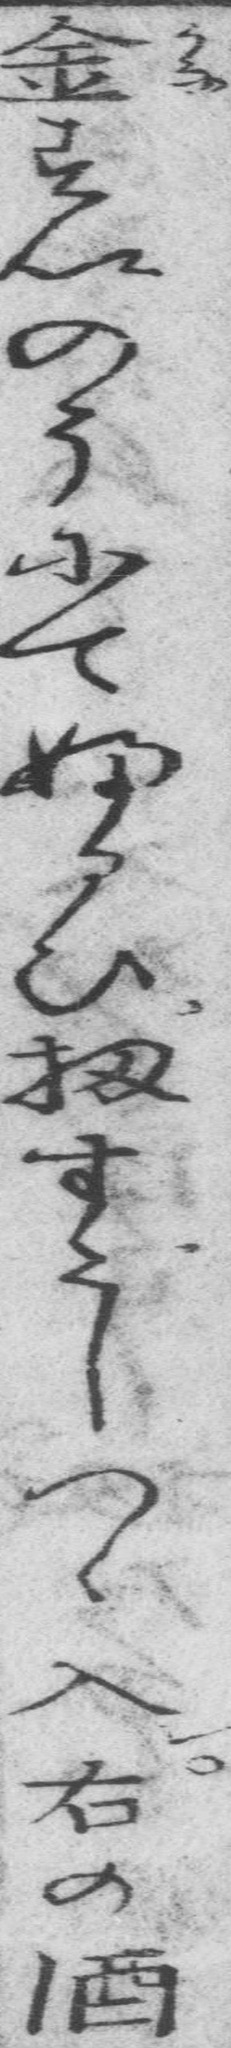金すいのうにてふるひ。扨すこしつゝ入れ。右の酒
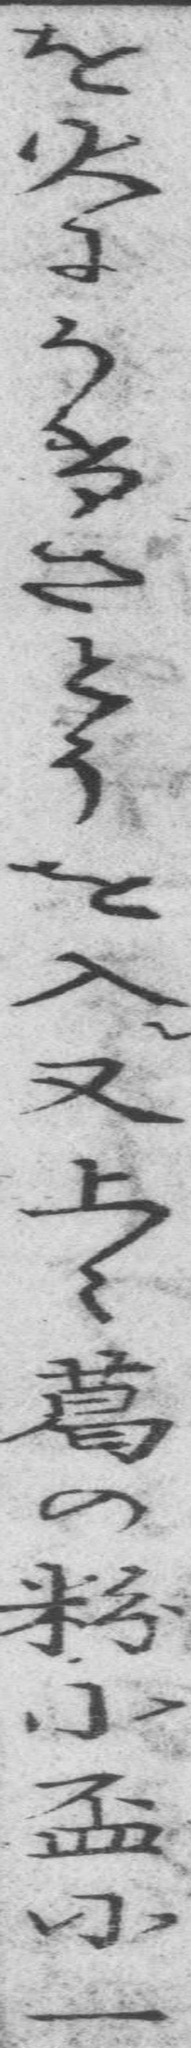を火にかけ。さとうを入れ。又上々葛の粉。小盃に一
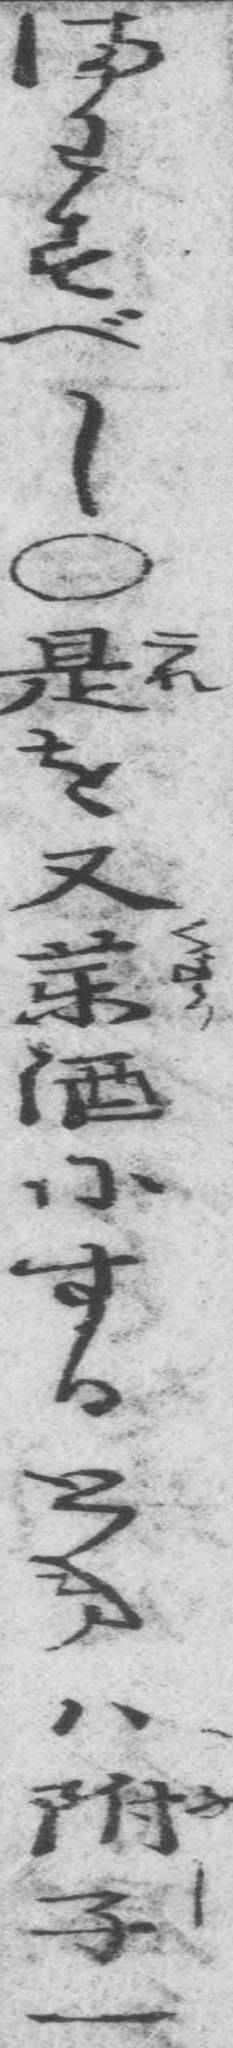まわすべし○是を又薬酒にするときは。附子一
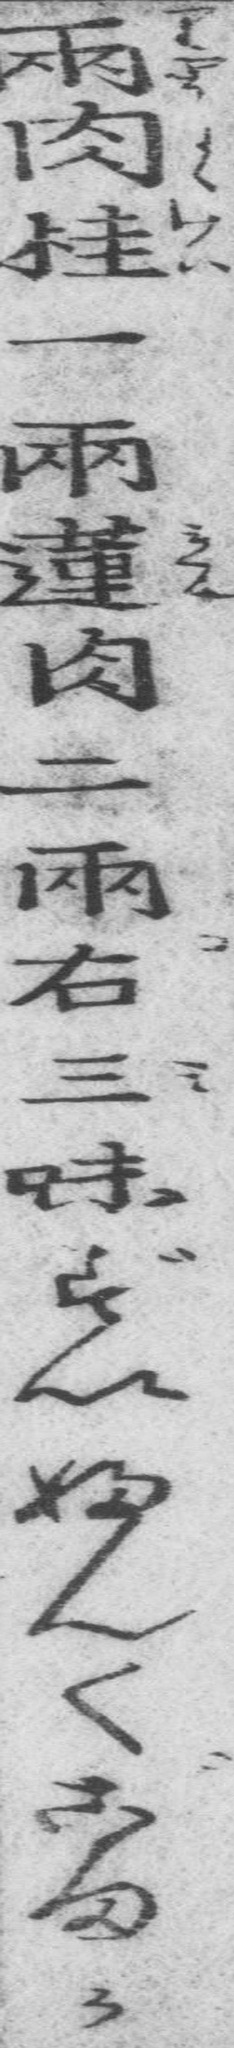両肉桂一両蓮肉二両。右三味ずいふん〳〵。こまか
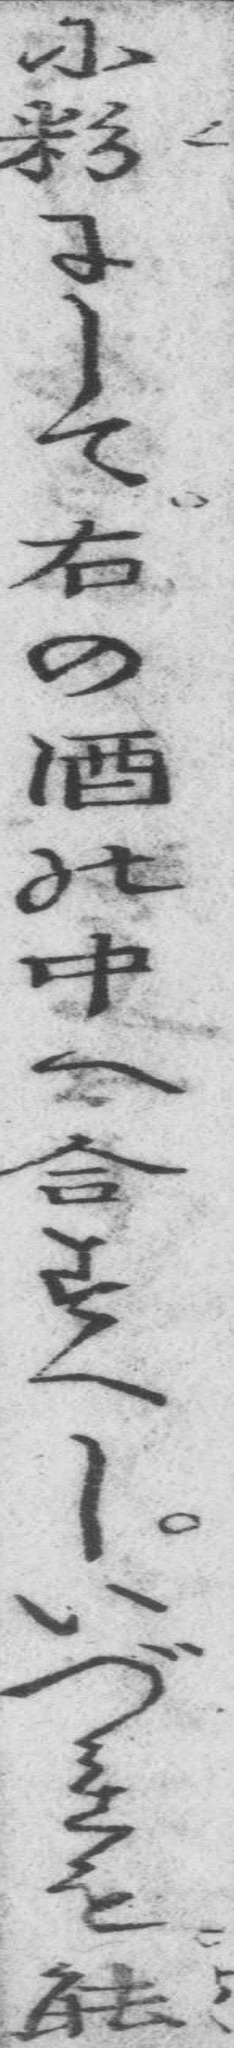に粉にして。右の酒の中へ合すへし。いづれも。能
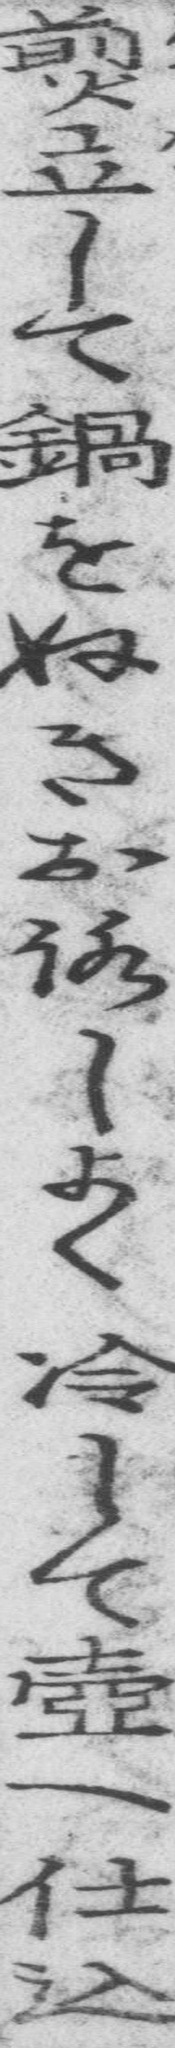煎立して鍋をふきおろしよく冷して。壺へ仕込
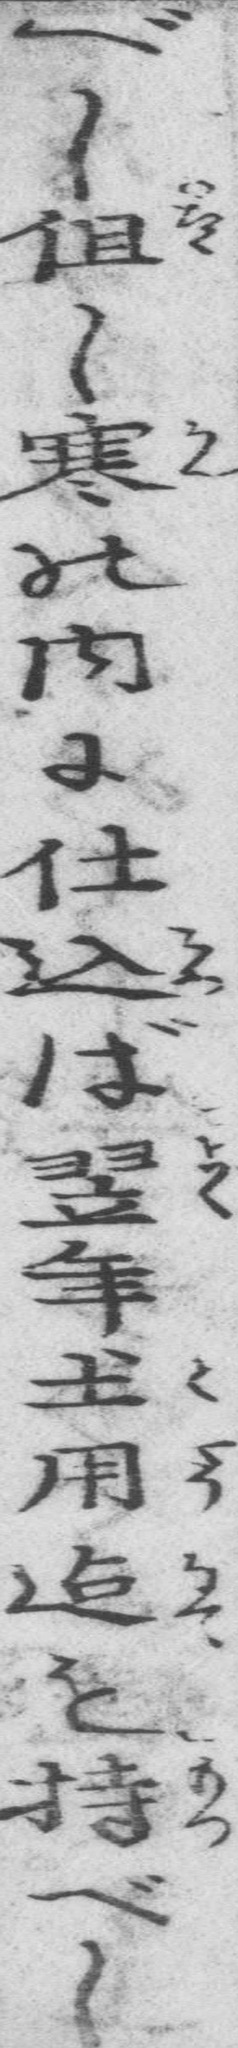べし。但し寒の内に仕込ば翌年土用迄も。持べし
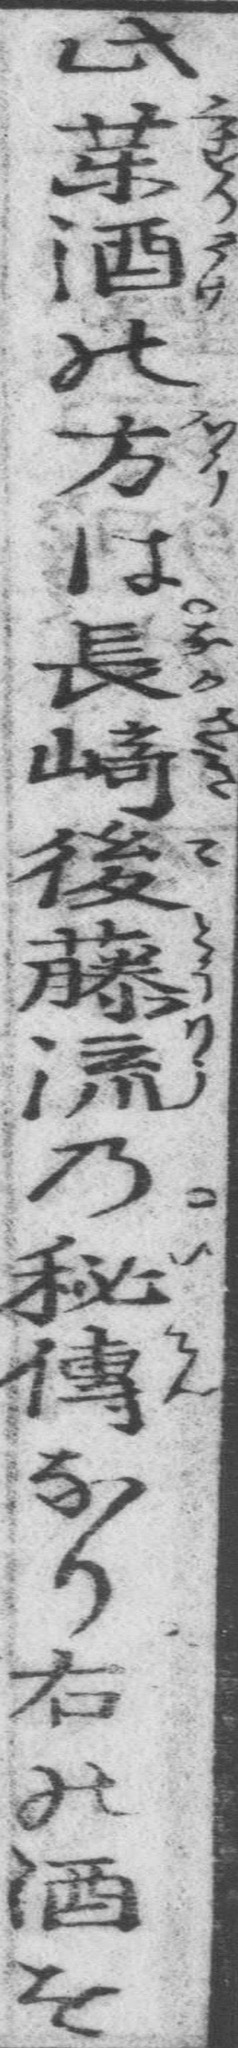此薬酒の方は。長崎後藤流の。秘伝なり。右の酒を
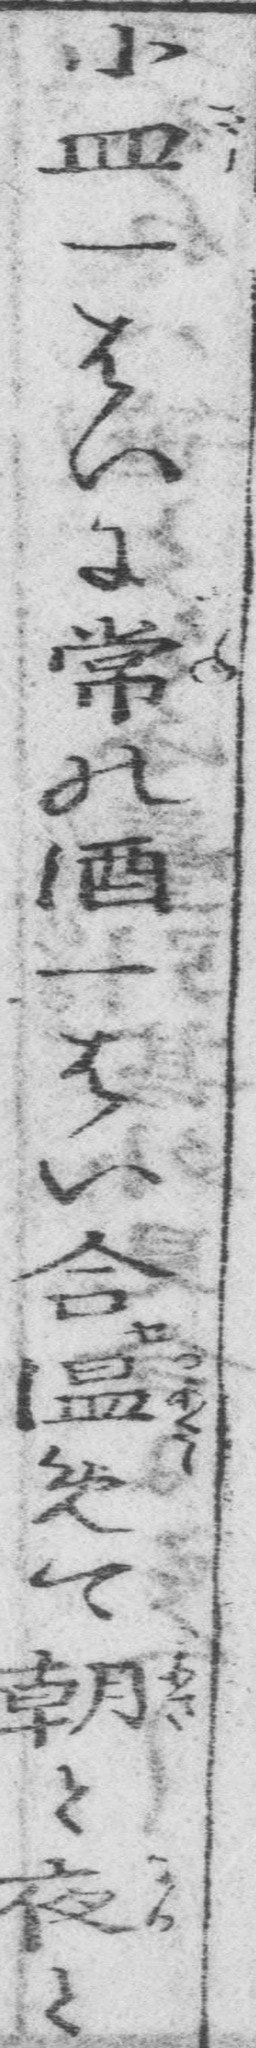小皿一はいに常の酒一はい合せ。温めて朝と夜と
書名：萬寳料理秘密箱
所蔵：大阪府立大学学術情報センター 国文学研究資料館
